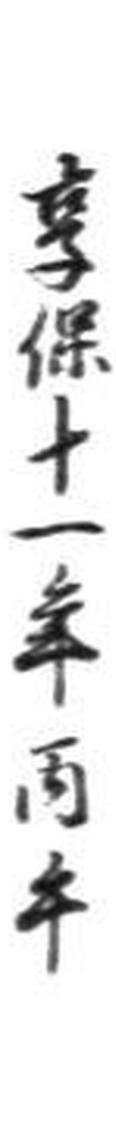享保十一年丙午
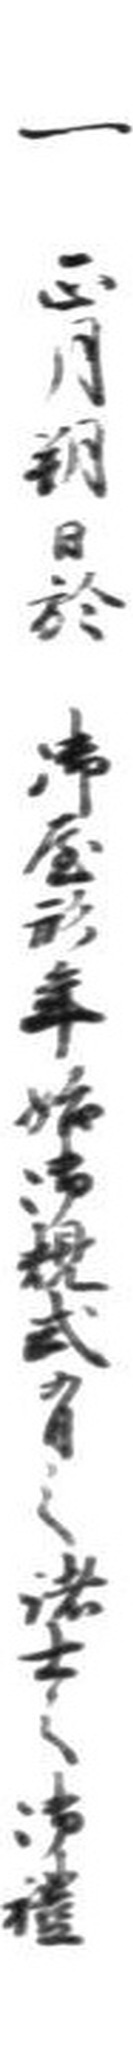一、正月朔日於御屋形年始御規式有之諸士之御礼
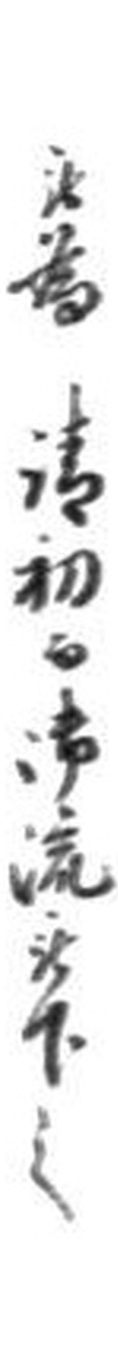被為請初而御流被下之
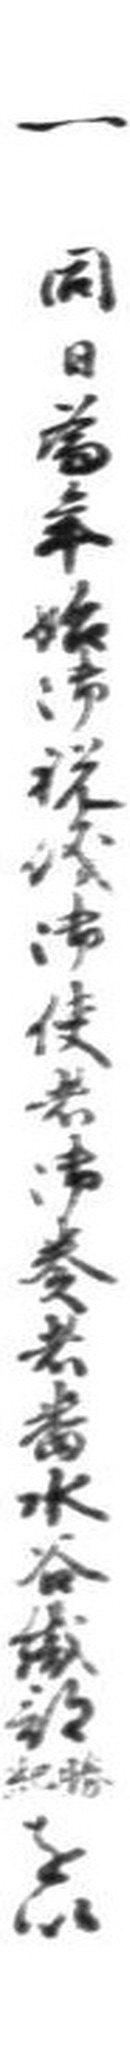一、同日為年始御祝儀御使者御奏者番水谷織部勝紀を以
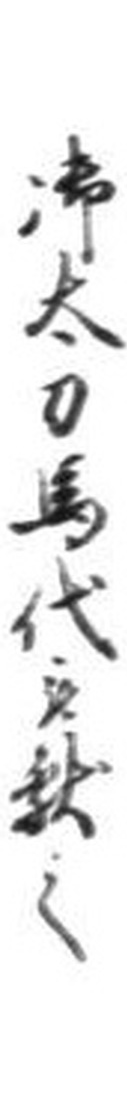御太刀馬代被献之
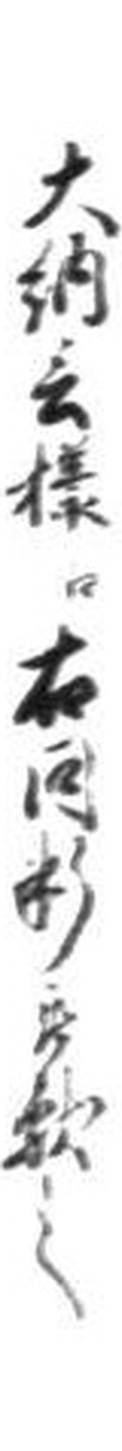大納言様江右同断被献之
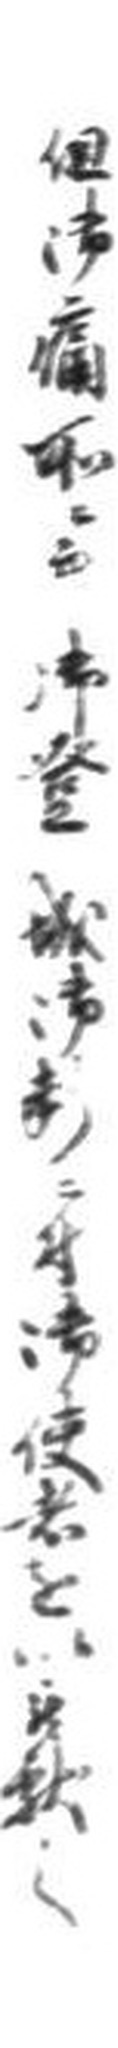但御痛所ニ而御登城御断ニ付御使者を以被献之

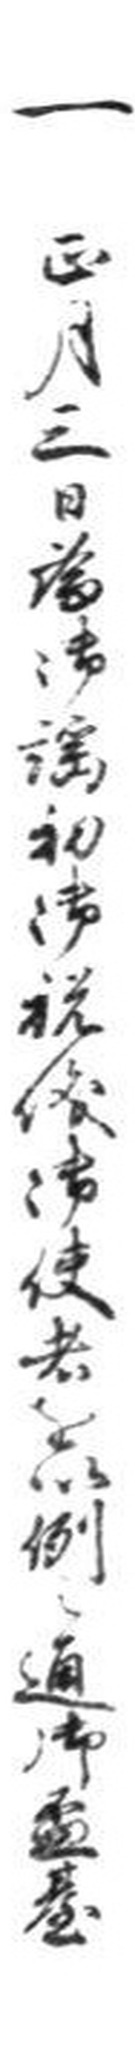一、正月三日為御謡初御祝儀御使者を以例之通御盃台
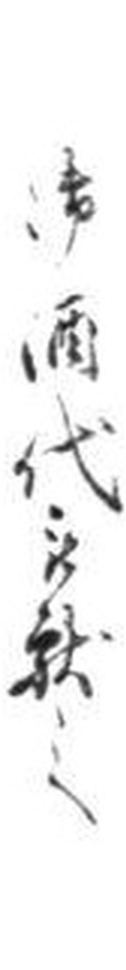御酒代被献之
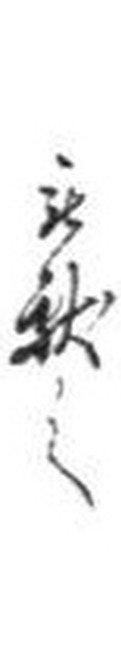被献之
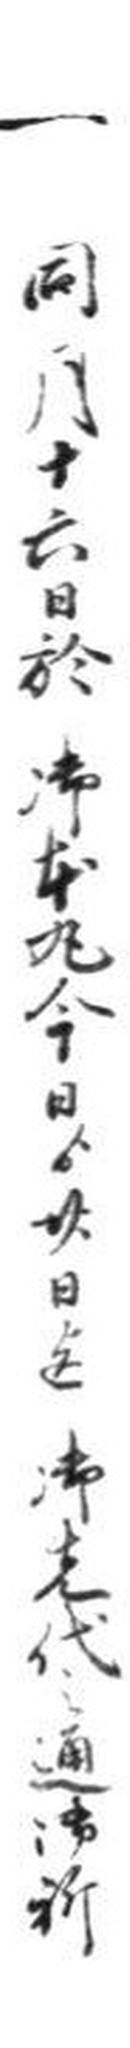一、同月十六日於御本丸今日ゟ廿日迄御先代之通御祈
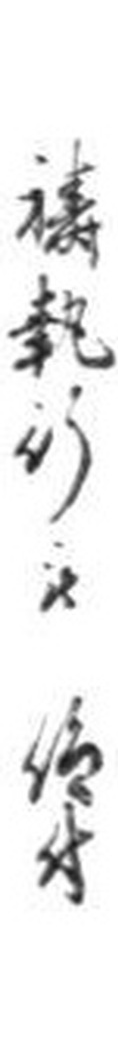祷執行被仰付
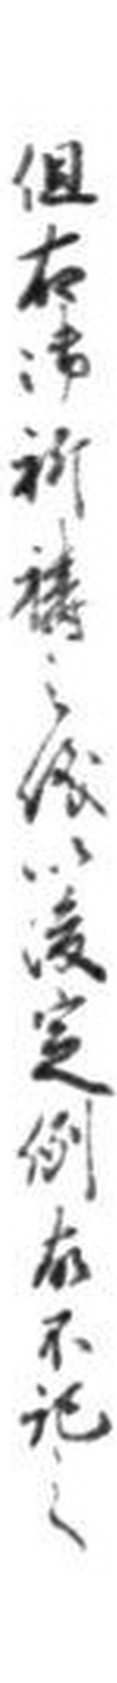但右御祈祷之儀以後定例故不記之
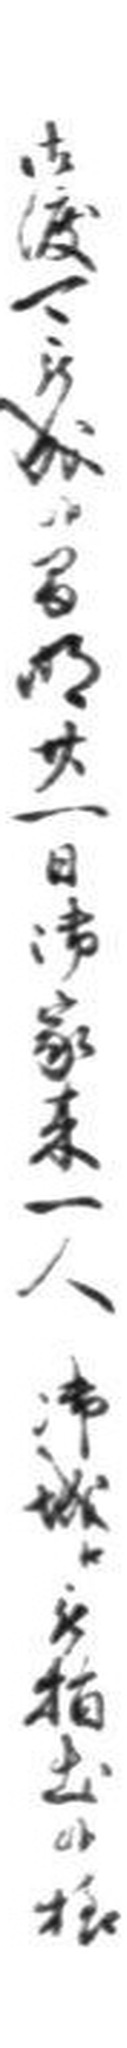御渡可被成候間明廿一日御家来一人御城江被指出候様
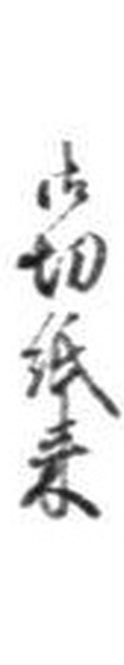御切紙来
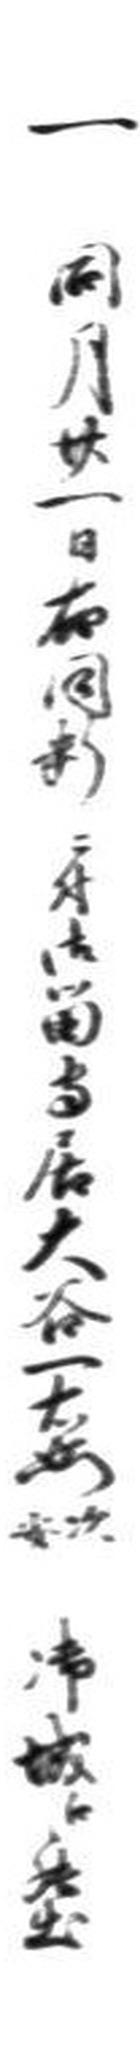一、同月廿一日右同断ニ付御留守居大谷一右衛門次安御城江罷出
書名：家譜 四十 宗矩公 従享保十一年到享保十二年
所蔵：福井県文書館 Fukui Prefectural Archives
